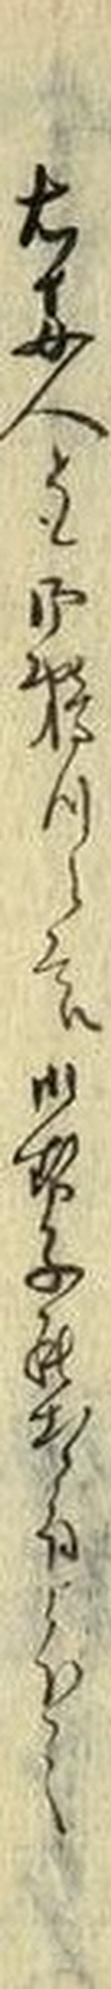右両人とも御鵜川之節御勢子罷出候ニ付被下之
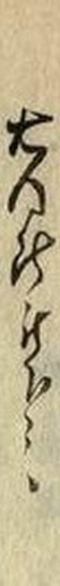右同断被下之
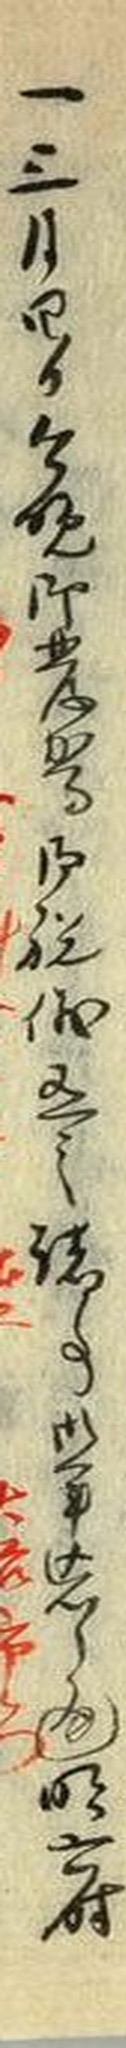一三月四日今晩御発駕御祝儀有之諸事御年忘之通明六時
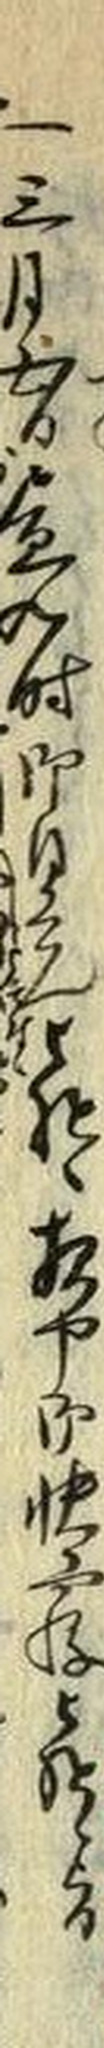一三月五日昼九時御目覚被遊候夜中御快寝被遊候旨
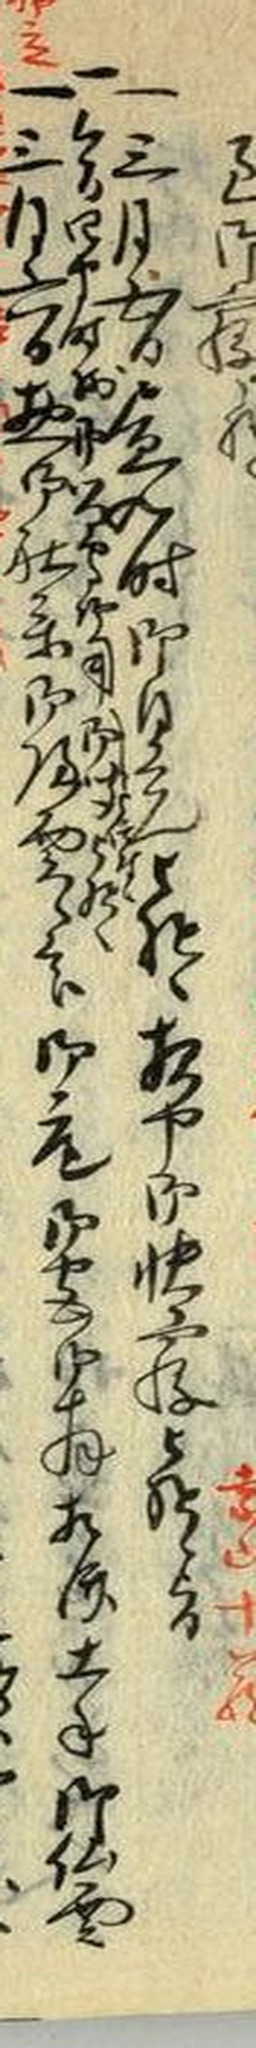一三月六日惣御社参御帰殿之節御庭御宮御拝相済土手御仏殿
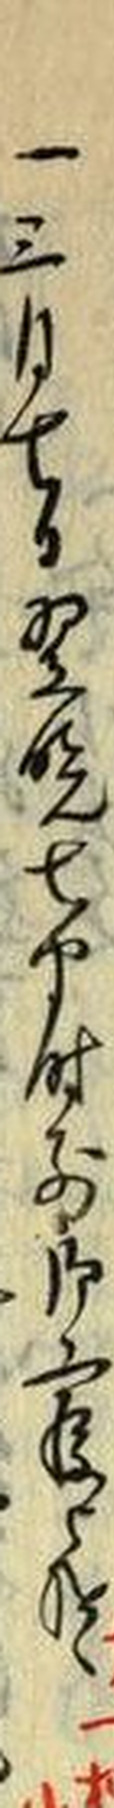一三月七日翌暁七半時前御寝被遊候
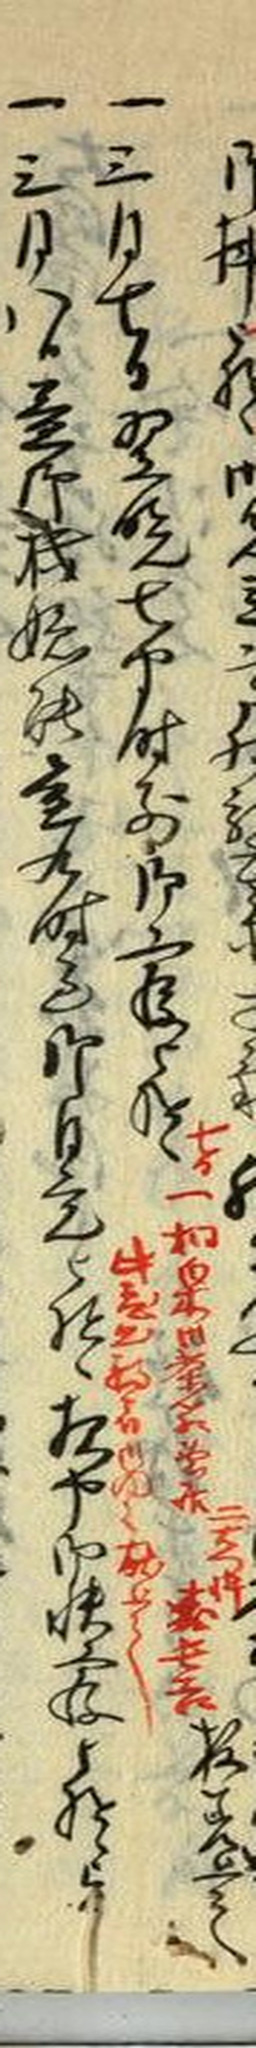一三月八日昼御機嫌能昼九時過御目覚被遊候夜中御快寝被遊候旨
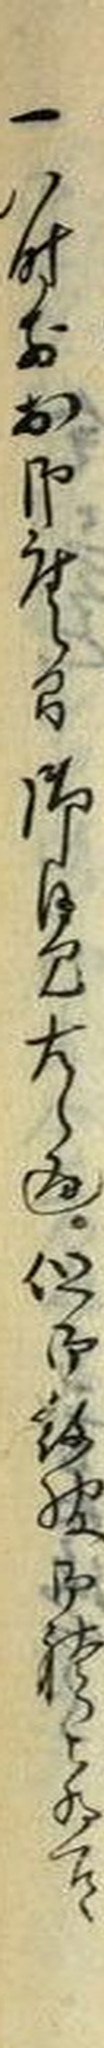一八時前於御座之間御目見左之通但御紋服御袴被為召候
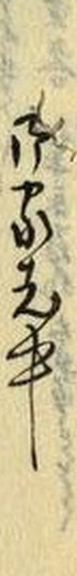御家老中
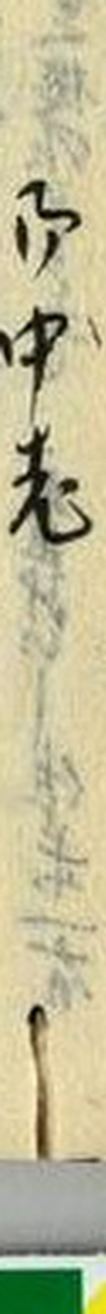御中老
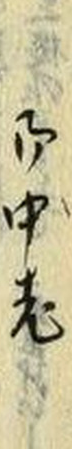御中老
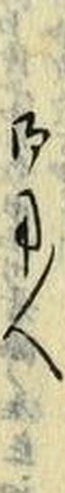御用人
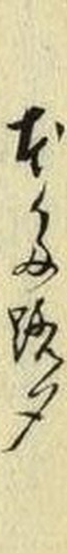本多路夕
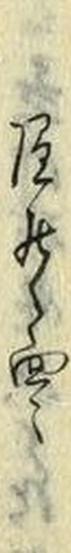隠居之面々
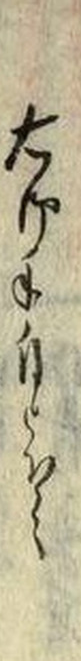右御手自下之
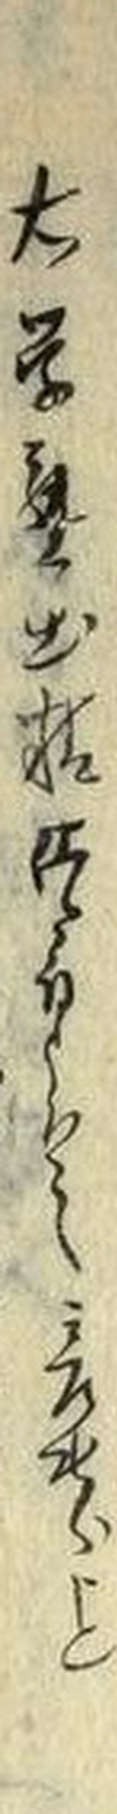右学塾出精仕候ニ付被下之彦次郎申上
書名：少傅日録抄（斉承付側向頭取日記、在国）
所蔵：福井県文書館 Fukui Prefectural Archives
